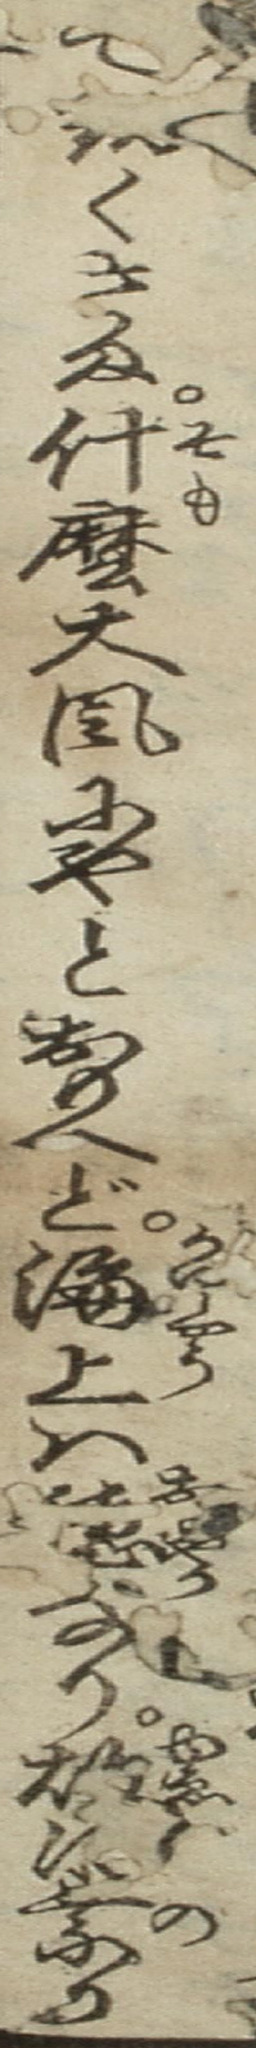して動くさま。什麼大風にやとおもへど。海上は穏なり。故に乗り
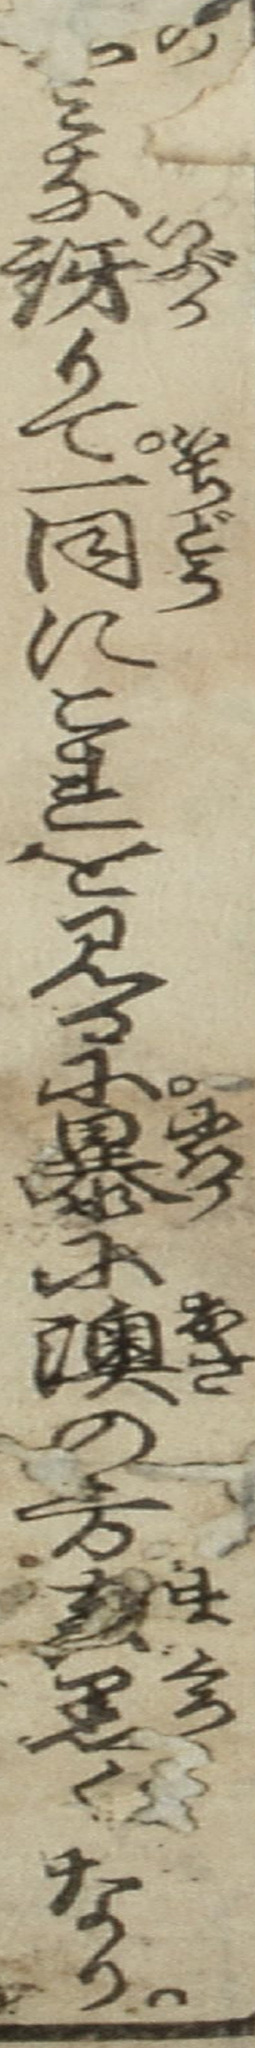組の者みな訝りて。一同にこれを見るに。暴に澳の方真黒くなり。
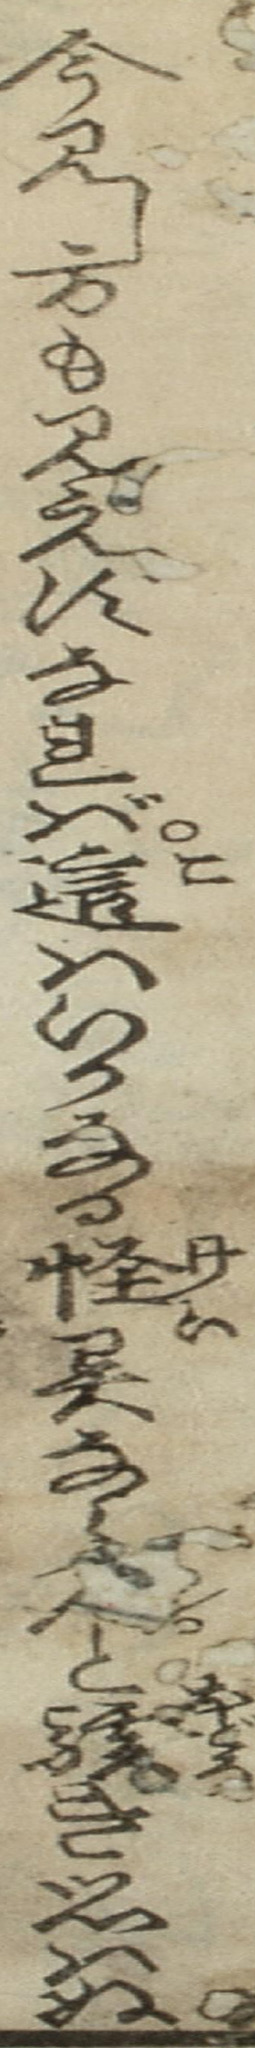今見し方も見えずなれば。這はいかなる怪異ならん。と駭き思はぬ
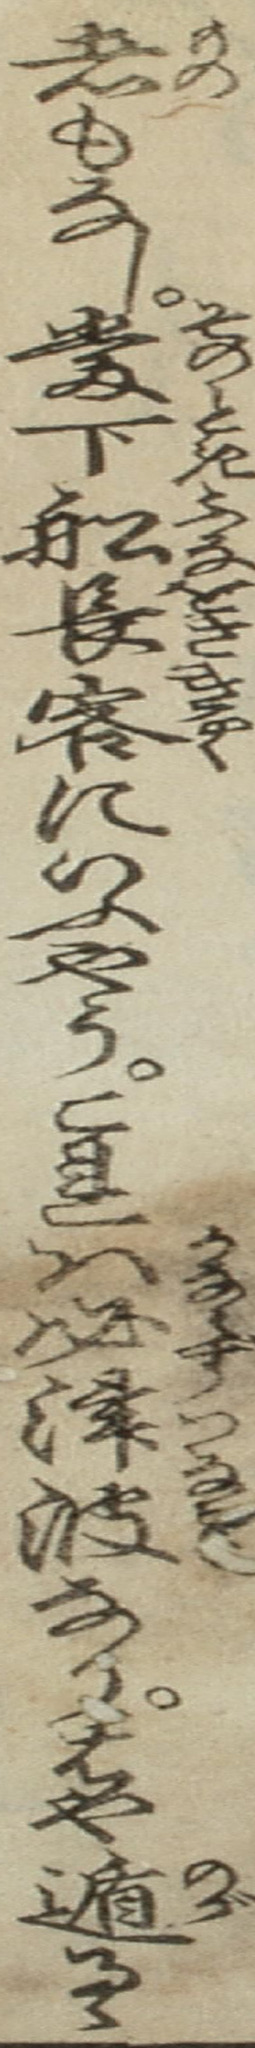者もなし。當下船長客にいふやう。これは必津浪なり。はや遁るゝ
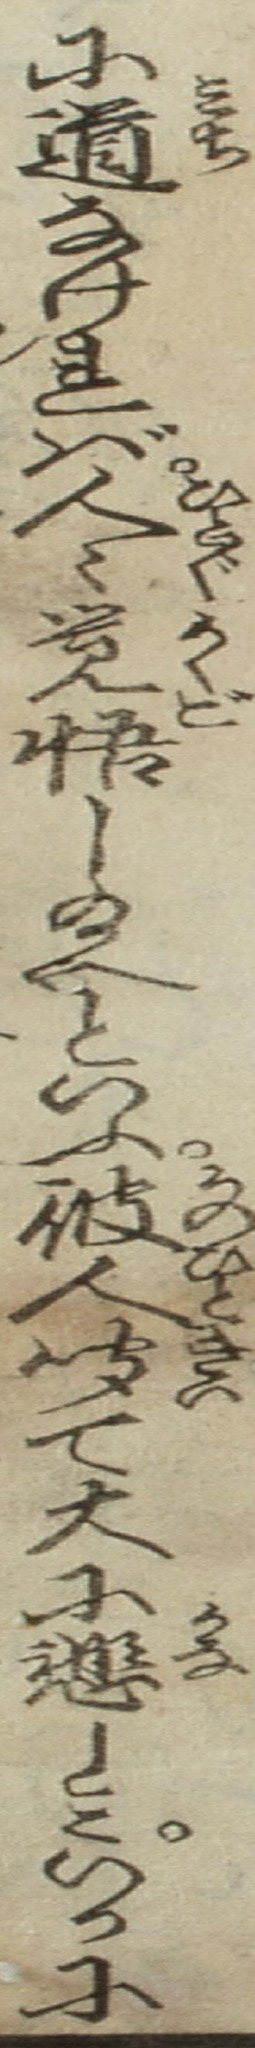に道なければ。人〻覚悟し給へといふ。彼人聞て大に悲しみ。いかに
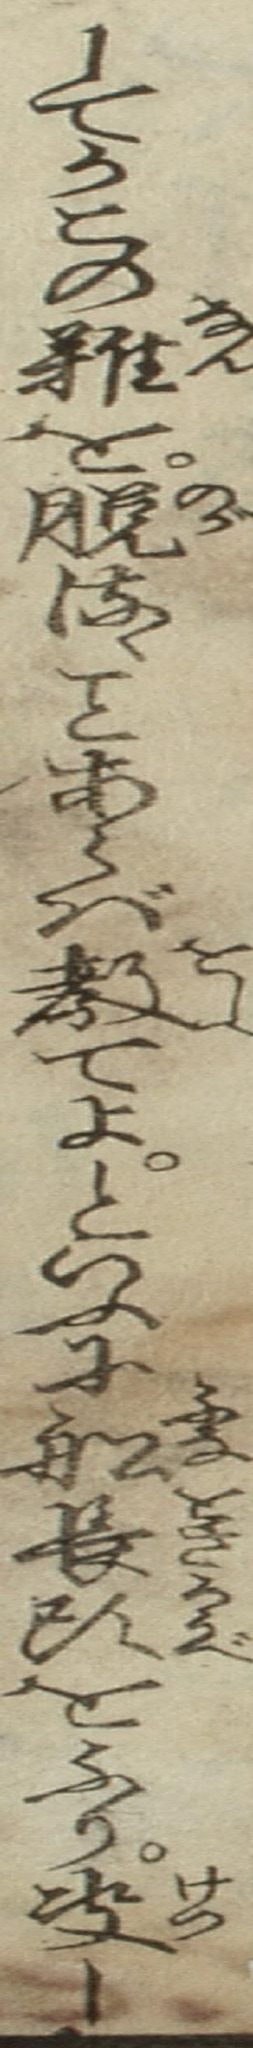してかこの難を脱るゝことあらば教てよ。といふに船長頭をふり。決し
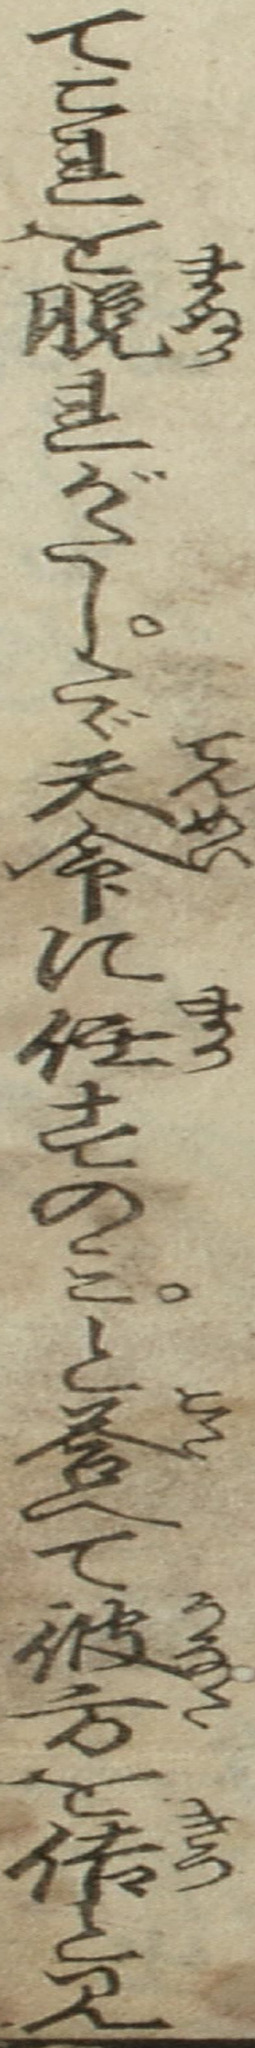てこれを脱れがたし。たゞ天命に任すのみ。と答へて彼方を佶と見
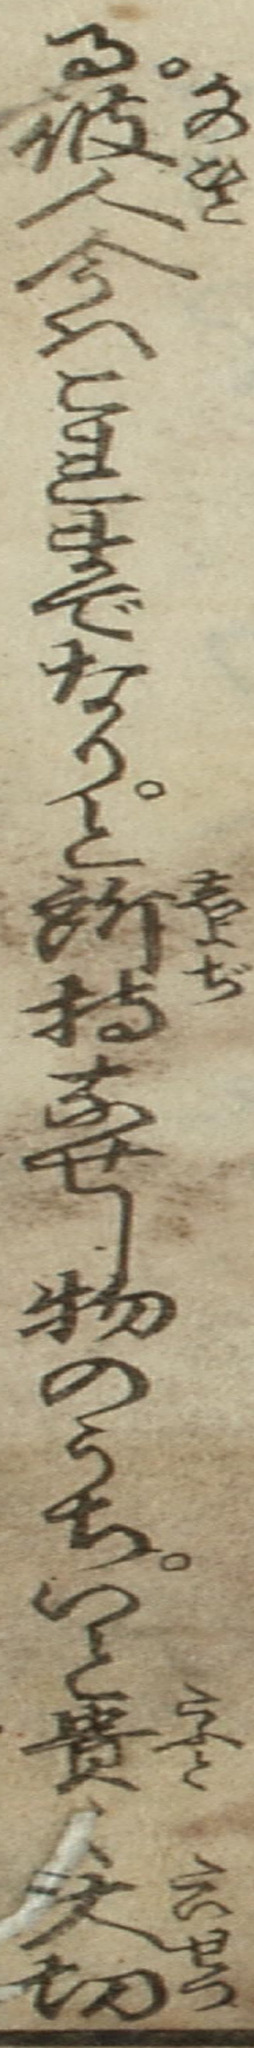る。彼人今はこれまでなり。と所持なせし物のうち。いと尊く大切
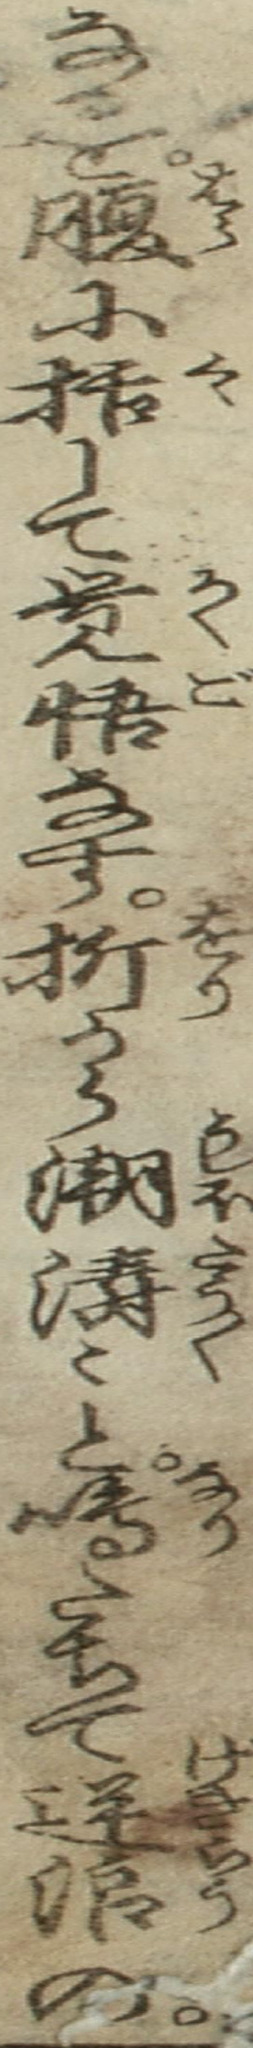なるを。腹に括して覚悟なす。折から潮涛〻と。鳴たちて逆浪の。
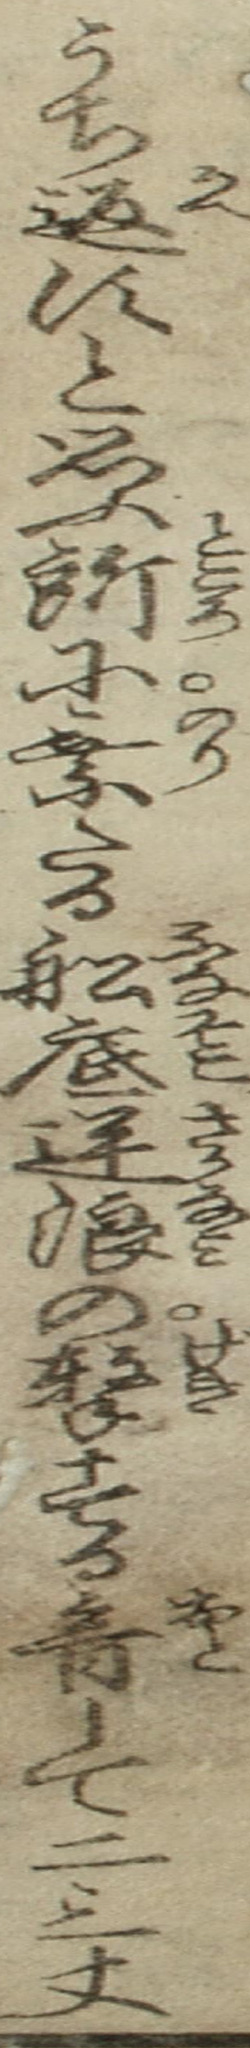うち返すと思ふ所に。乗たる船底逆浪の。撃する音してニ三丈
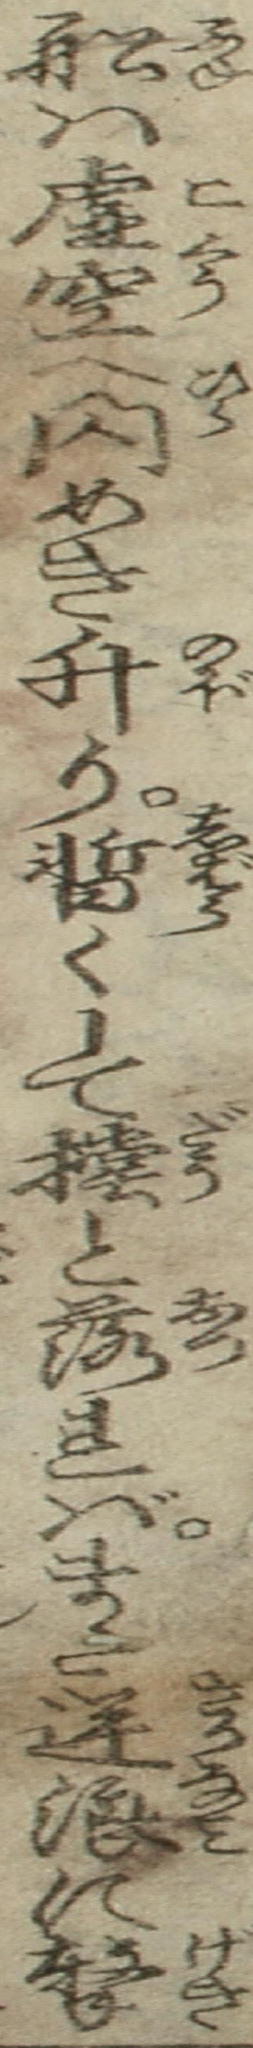船は虚空へ閃めき升り。暫くして摚と落れば。また逆浪に撃
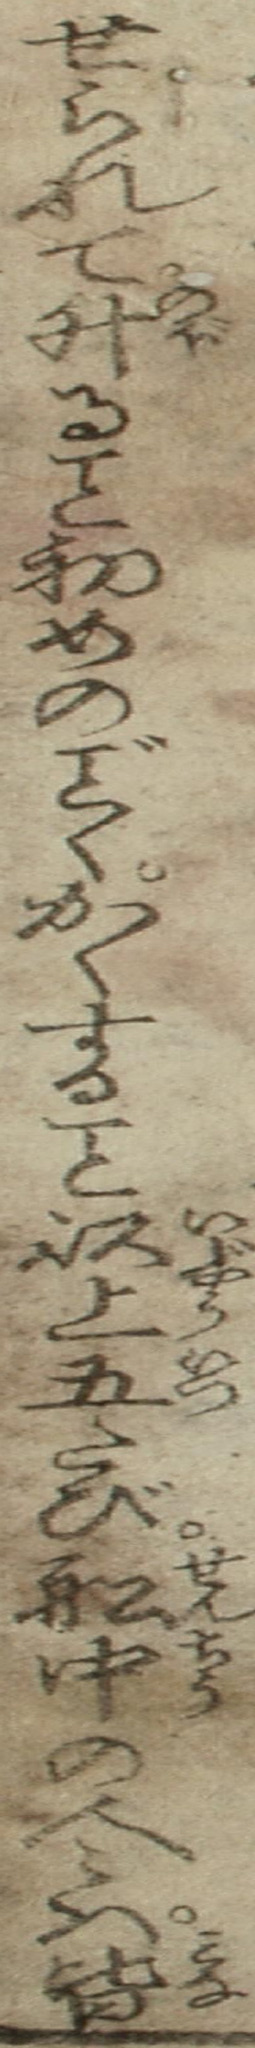せられて。升ること初めのごとく。かくすること以上五たび。船中の人〻は。皆

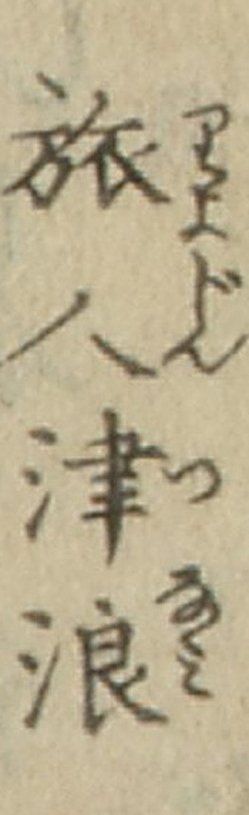旅人津浪

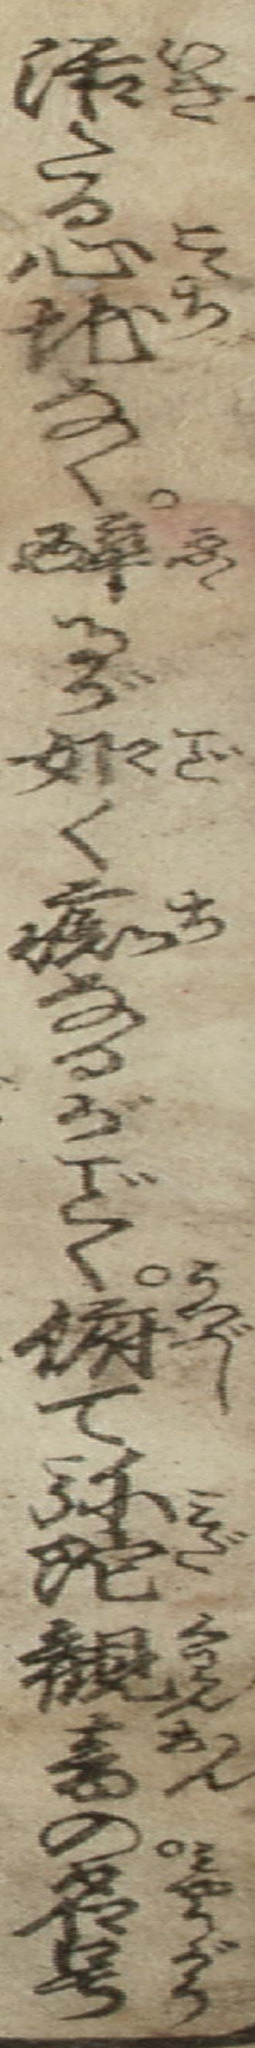活たる心地なく。酔るが如く痴なるがごとく。俯て弥陀観音の。名号
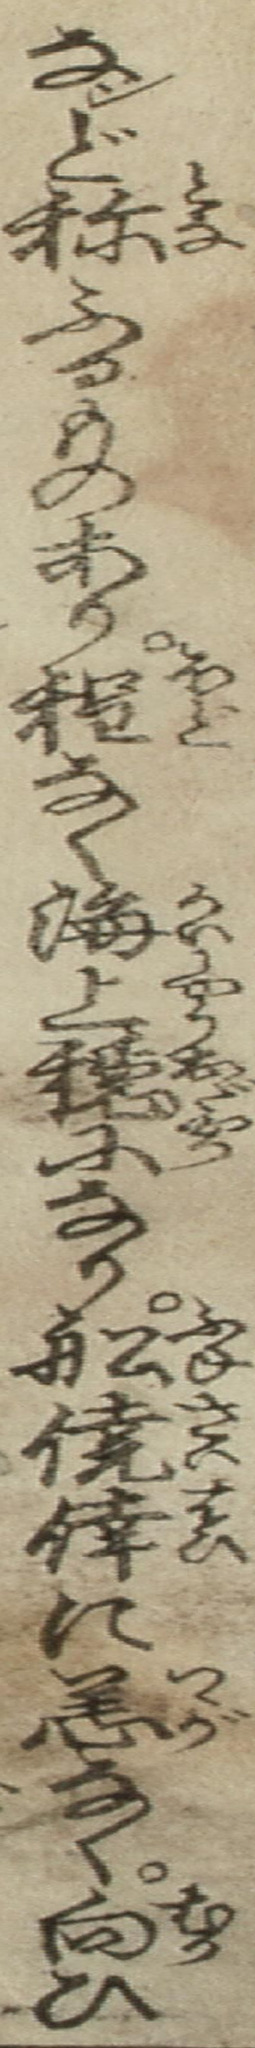なんど称ふるものあり。程なく海上穏になり。船僥倖に恙なく。向ひ
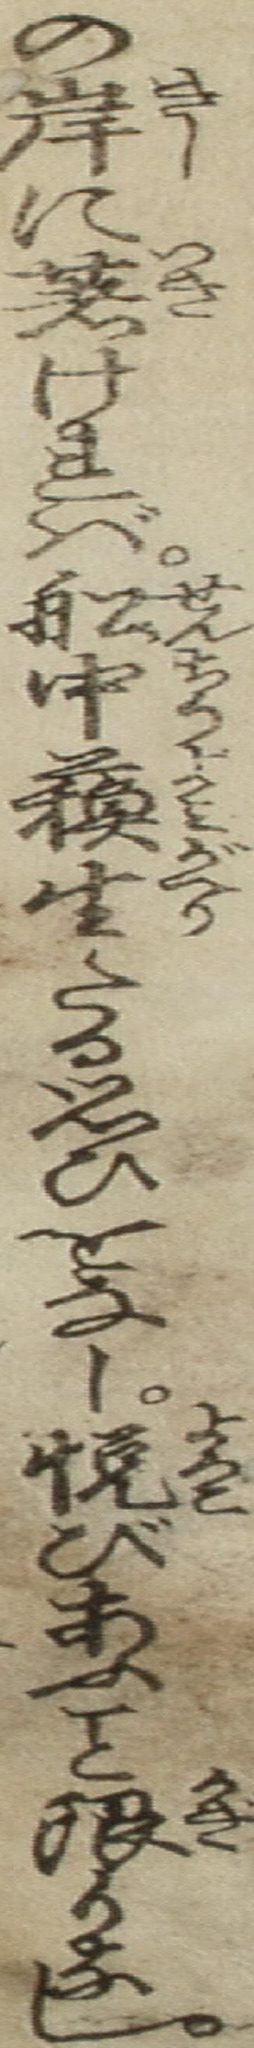の岸に著ければ。船中蘓生たる思ひをなし。悦びあふこと限りなし。
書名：安政見聞録　中
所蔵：東京大学地震研究所図書室 Earthquake Research Institute Library, The University of Tokyo, JAPAN
